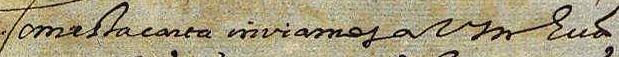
Com esta carta inviamos a V M huā
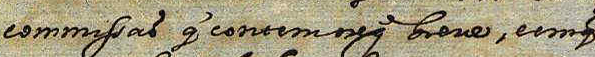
commissaõ q̄ contem nego breue, e em q̄
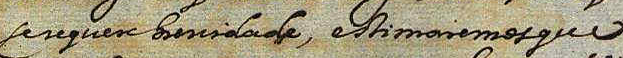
se requer breuidade, estimaremos que
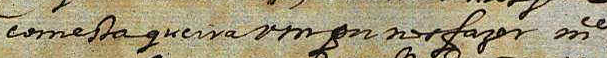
com esta queira v m por nos fazer mce
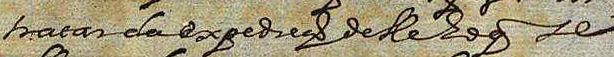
tratar da expedicaõ delle ho q̄ se
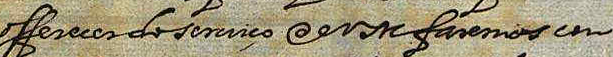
offerecer do seruiço de V M faremos com
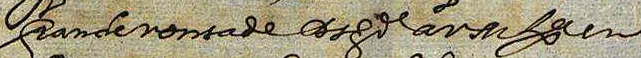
grande vontade Ds̄ gde a V M Lxa em
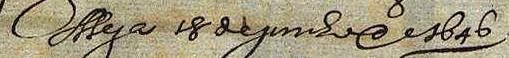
Meza 18 de junho de 1646
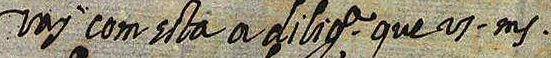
vaj com Esta a dilig.a que vs. ms.
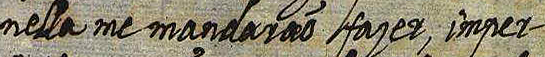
nella me mandaraõ fazer, imper
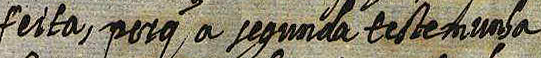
feita, porq̄ a segunda testemunha
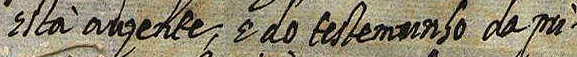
Està auzente, E do testemunho da pri
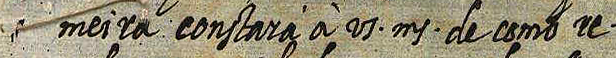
meira constará à vs. ms. de como re
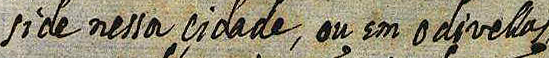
side nessa çidade, ou Em odivellas,
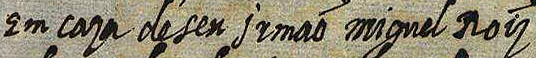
Em caza de seu jrmaõ miguel Roiz
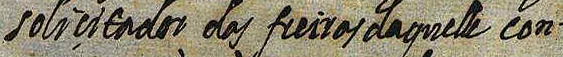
soliçitador das freiras daquelle con
